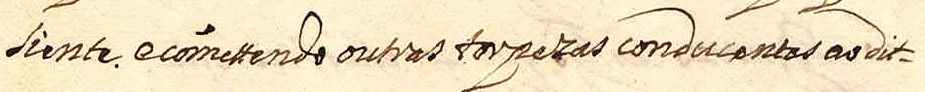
siente e com̄ettendo outras torpezas conducentes ao di
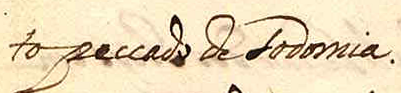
to peccado de sodomia.
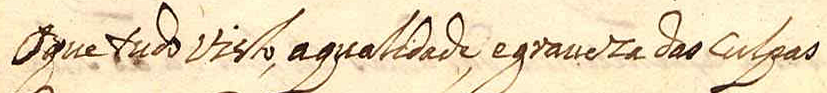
O que tudo visto, a qualidade, e graueza das culpas
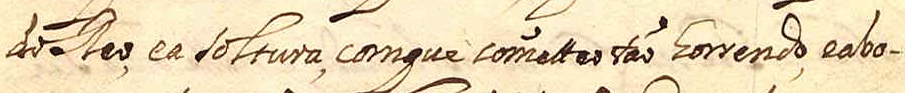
do Reo, e a soltura, com que com̄etteo taõ horrendo, e abo
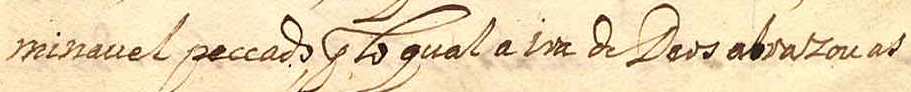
minauel peccado, plo qual a ira de Deps abrazou as
